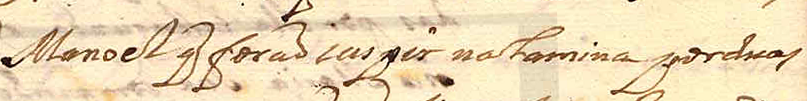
Manoel q̄ foraõ cuspir na lamina por duas
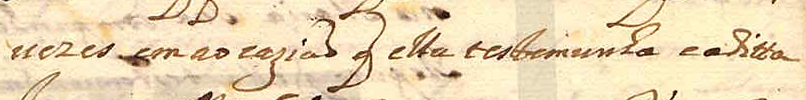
uezes em a ocaziaõ q̄ ella testemunha e a ditta
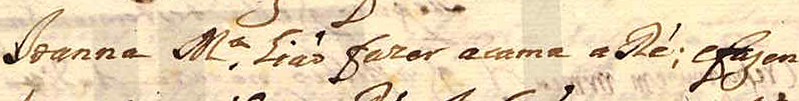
Ioanna M.a hiaõ fazer a cama a Ré; e fazen
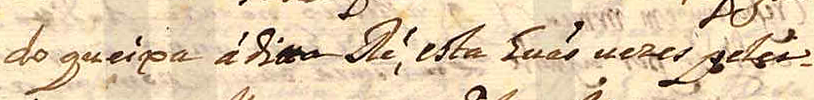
do queixa à ditta Ré, esta huās uezes pelei
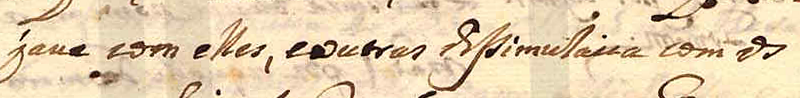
jaua com elles, e outras dissimulaua com os
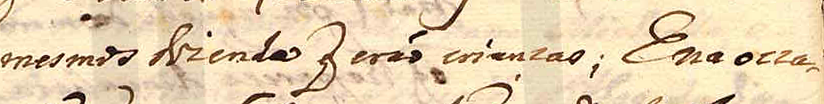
mesmos dizendo q̄ eraõ crianças; E na occa
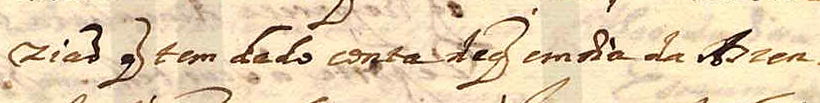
ziaõ q̄ tem dado conta de q̄ em dia da Ascen
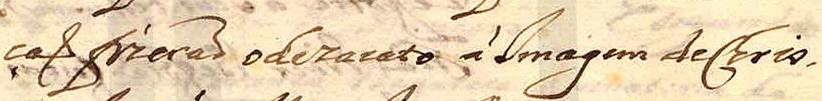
çaõ fizeraõ o dezacato à Imagem de Chris
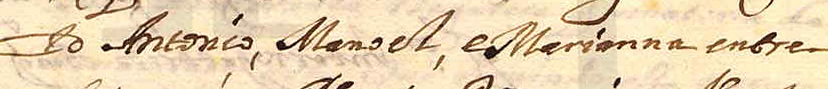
to Antonio, Manoel, e Marianna entre
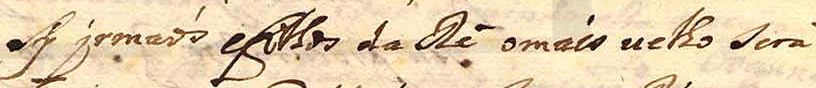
sy jrmaõs e filhos da Ré o mais uelho será
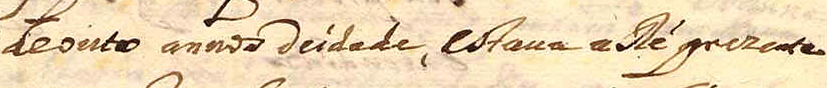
de outo annos de idade, estaua a Ré prezente
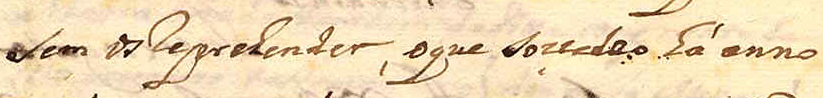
sem os Reprehender, o que soccedeo há anno
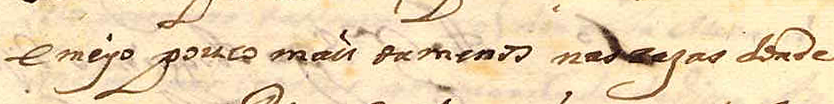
e meyo pouco mais ou menos nas cazas donde
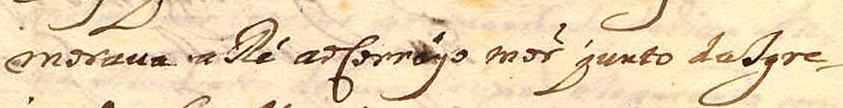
moraua a Ré ao Correyo mor junto da Igre
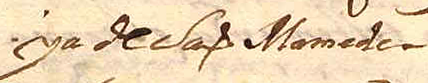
ya de Saõ Mamede.
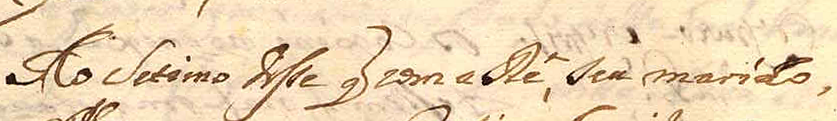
Ao Setimo disse q̄ com a Ré, seu marido,
